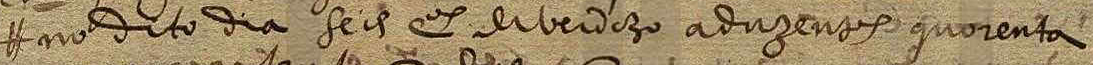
item no dito dia seis cos de verdozo a duzentos quorenta
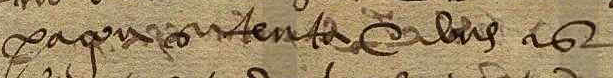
pagou setenta e dous rs
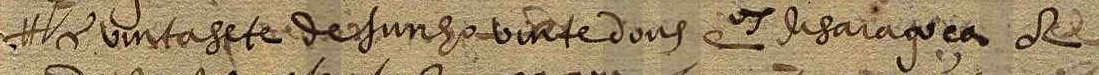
item ē vinta sete de Junho vinte dous cos de saragoça A
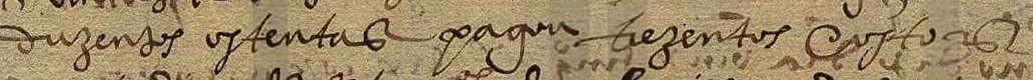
duzentos ojtenta rs pagou trezentos e ojto rs
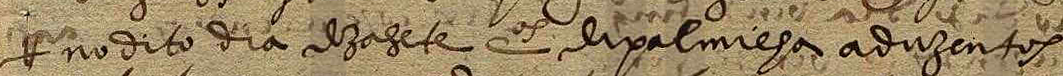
item no dito dia dezasete cos de palmilha a duzentos
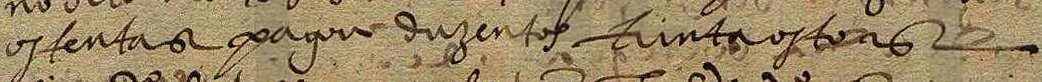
ojtentas rs pagou duzentos trinta ojto rs
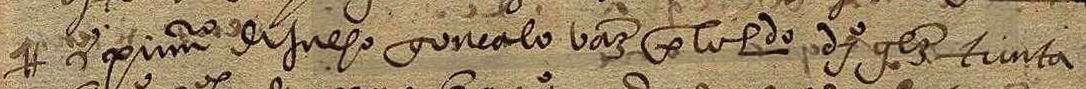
item ē primro de Julho gonçalo vāz p̄lo Ldo djo glz̄ trinta
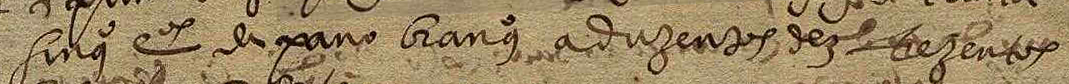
sinqo cos de pano branqo a duzentos dez trezentos
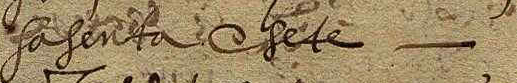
sasenta e sete
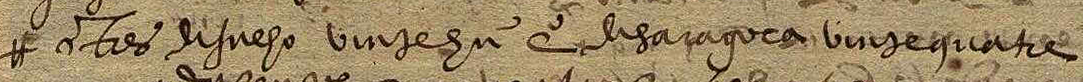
item ē tres de Julho vinte hū co de saragoça vinte quatre
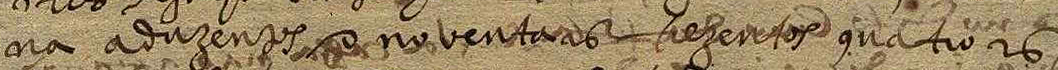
na a duzentos e noventa rs trezentos quatro rs
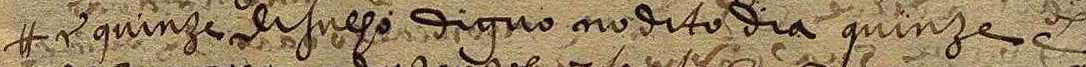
item ē quinze de Julho diguo no dito dia quinze cos
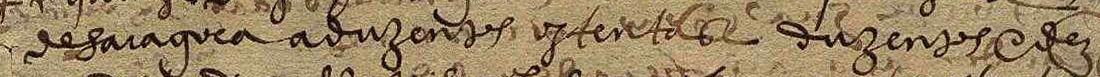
de saragoça a duzentos ojtenta rs duzentos e dez
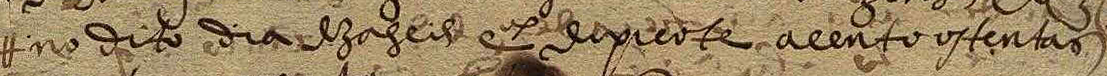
item no dito dia dezaseis com de picote a cento ojtenta rs
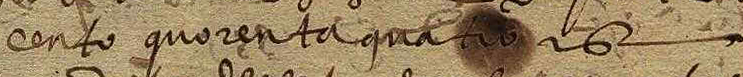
cento quorenta quatro rs
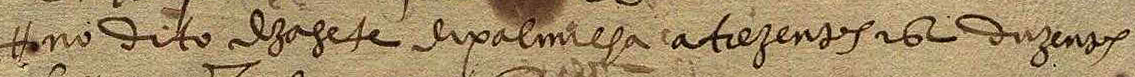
item no dito dezasete de palmilha a trezentos rs duzentos
